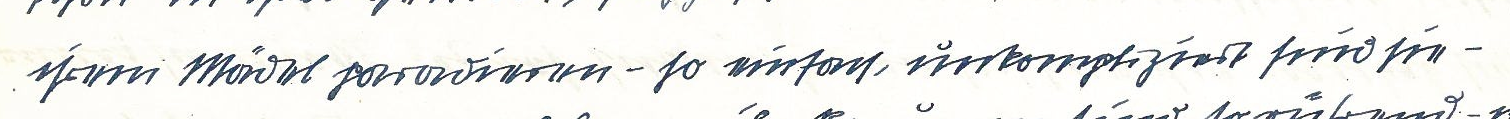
ihrem Mädel paradieren – so einfach, unkompliziert sind sie –
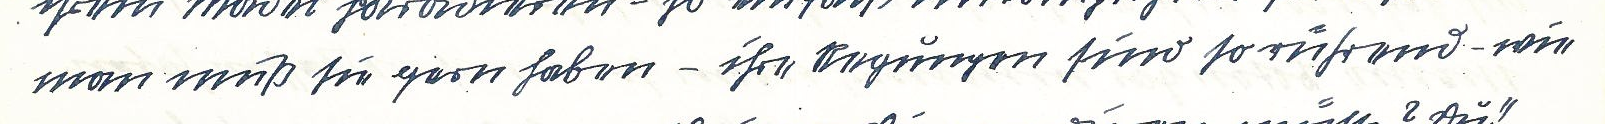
man muß sie gern haben – ihre Regungen sind so rührend – wie
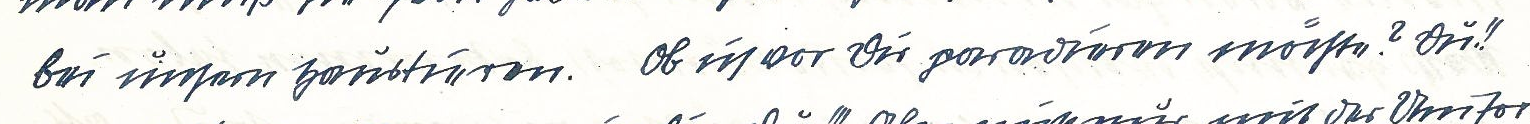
bei unsern Haustieren. Ob ich vor Dir paradieren möchte? Du!!
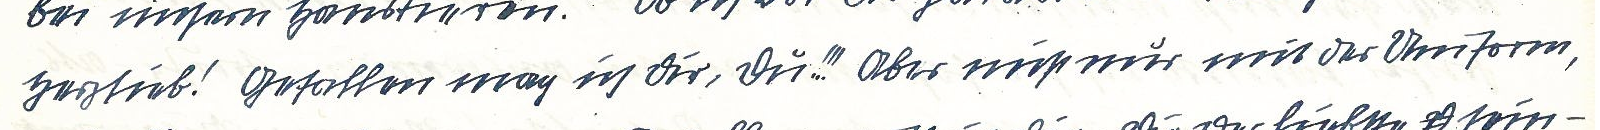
Herzlieb! Gefallen mag ich Dir, Du!!! Aber nicht nur mit der Uniform,
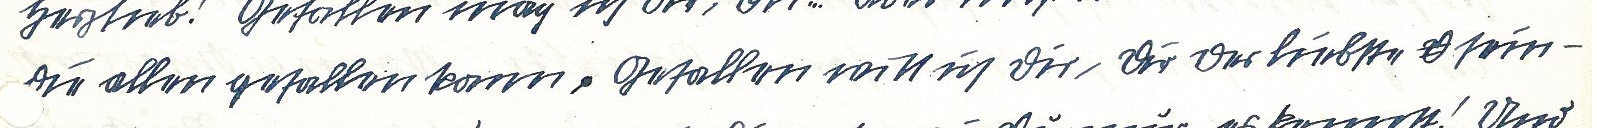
die allen gefallen kann. Gefallen will ich Dir, Dir der liebste d sein –
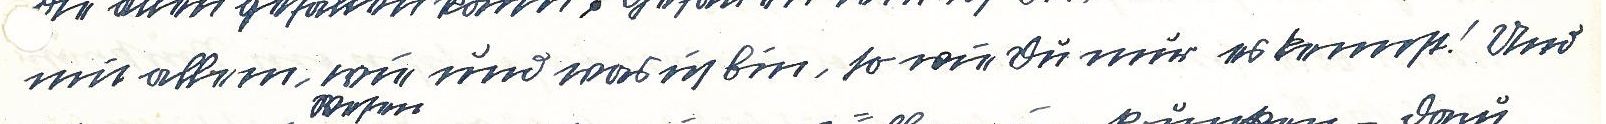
mit allem, wie und was ich bin, so wie Du nur es kannst! Und
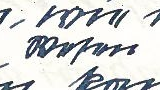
Wesen
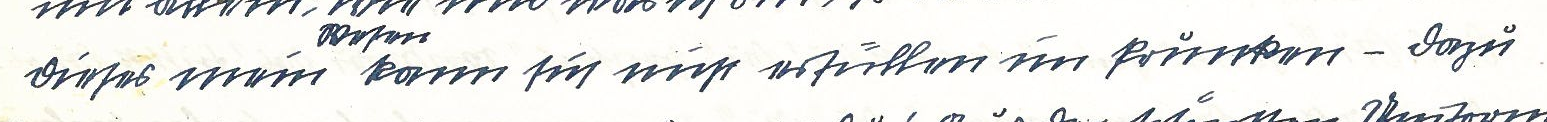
dieses mein kann sich nicht erfüllen im Prunken – dazu
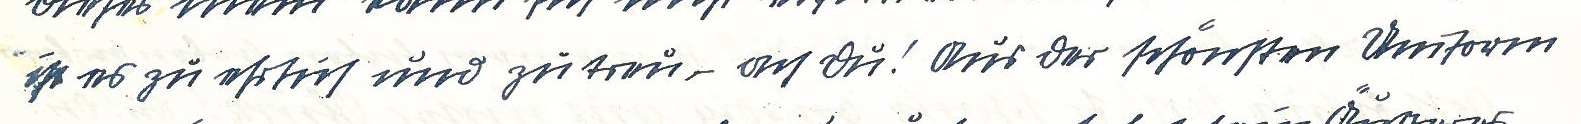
ist es zu ehrlich und zu treu – ach Du! Aus der schönsten Uniform
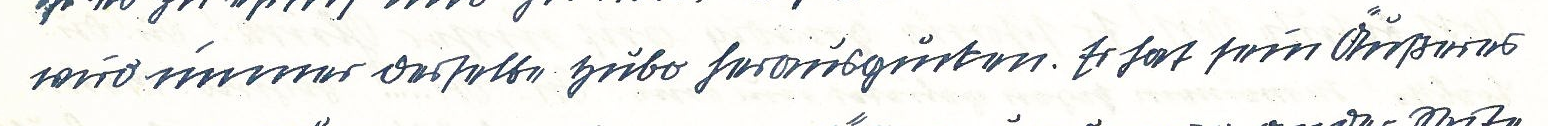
wird immer der selbe Hubo herausgucken. Er hat sein Äußeres
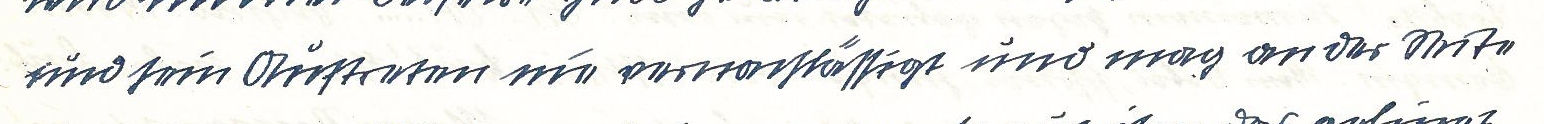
und sein Auftreten nie vernachlässigt und mag an der Seite
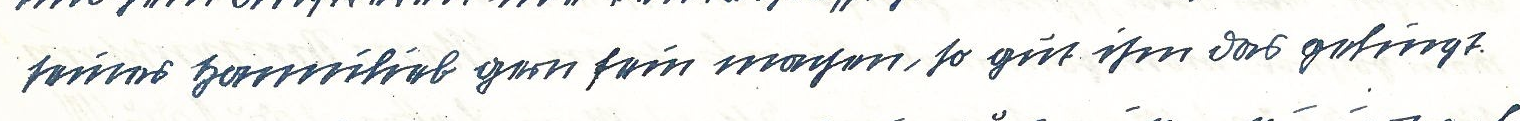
seines lieb gern fein machen, so gut ihm das gelingt.
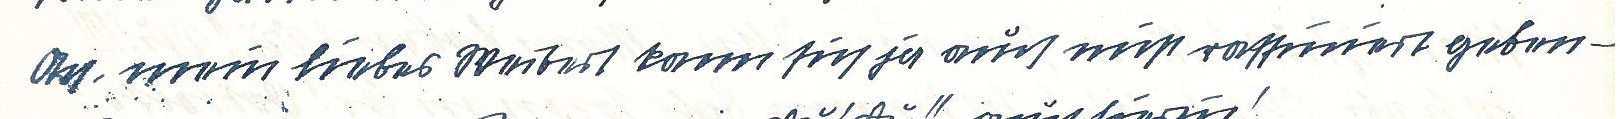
Ach, mein liebes Weiberl kann sich ja auch nicht raffiniert geben –
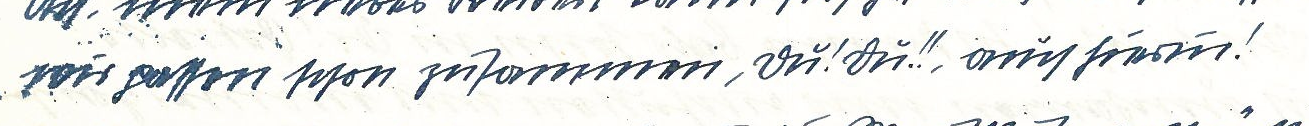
wir passen schon zusammen, Du! Du!!, auch hierin!
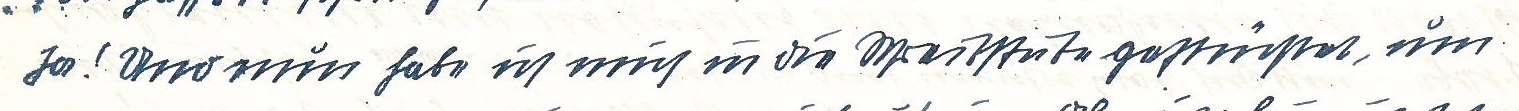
Ja! Und nun habe ich mich in die Schreibstube geflüchtet, um
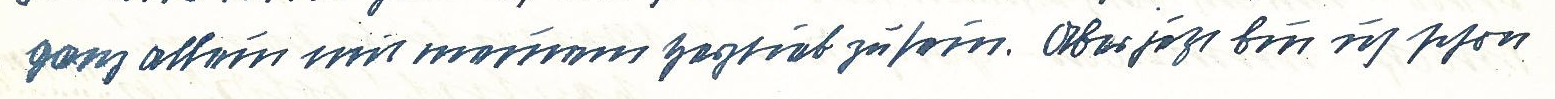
ganz allein mit meinem Herzlieb zu sein. Aber jetzt bin ich schon
